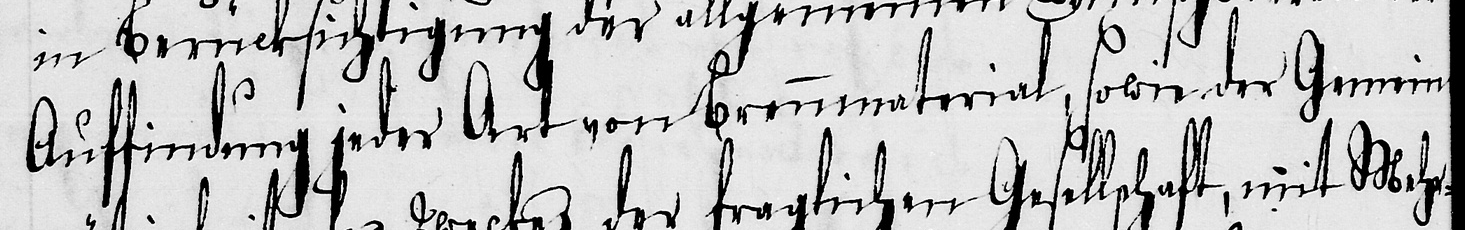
Auffindung jeder Art von Brennmaterial, sowie der Gemein¬
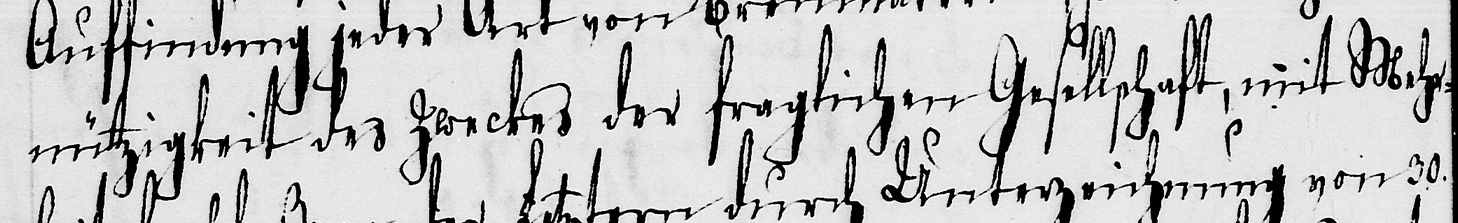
nützigkeit des Zweckes der fraglichen Gesellschaft, mit Meh¬
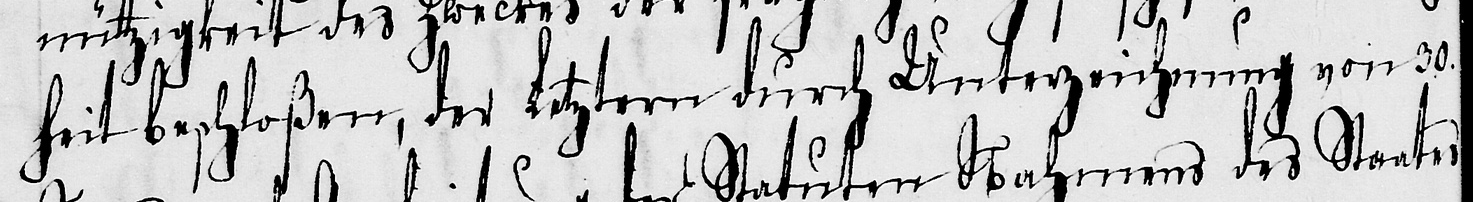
rheit beschloßen, der Letzern durch Unterzeichnung von 30.
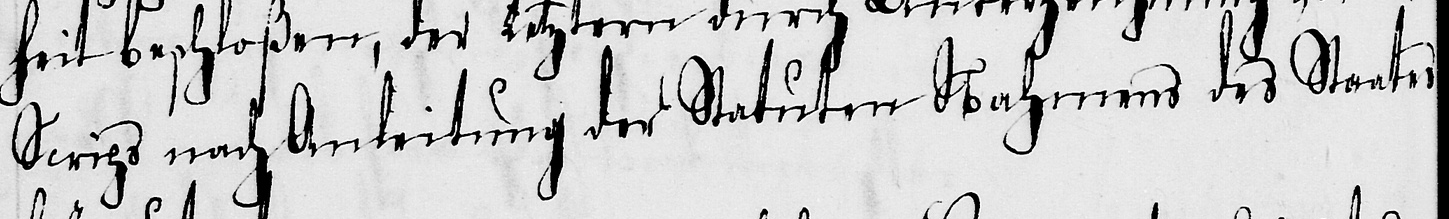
Scrips nach Anleitung der Statuten Nahmens des Staates
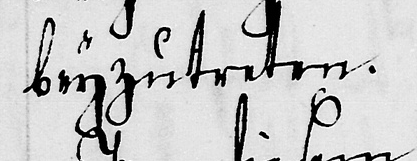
beyzutreten.
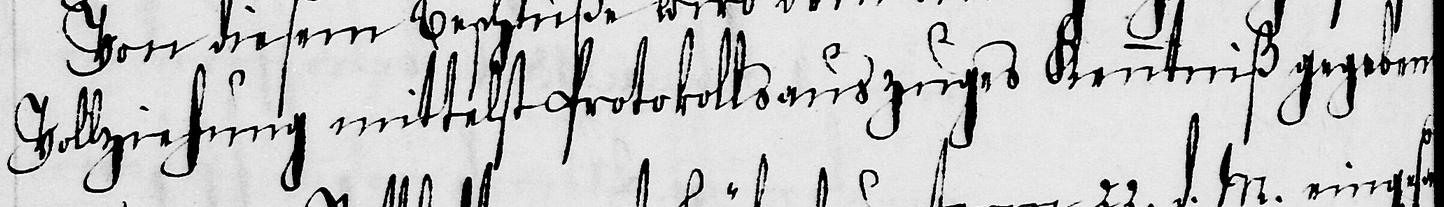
Vollziehung mittelst Protokollsauszuges Kenntniß gegebe¬
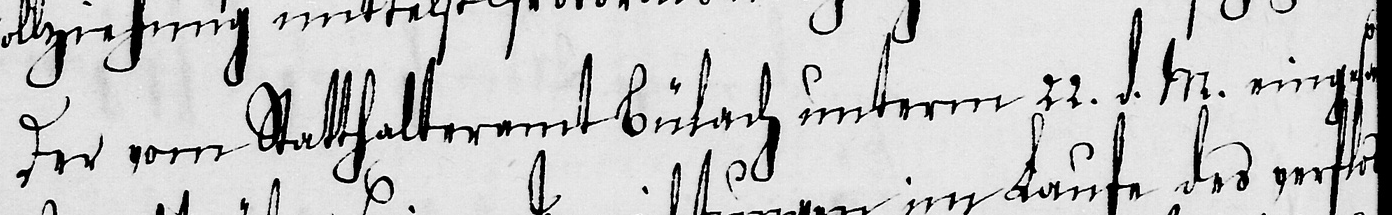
Der vom Statthalteramt Bülach unterm 22. d. M. einge¬
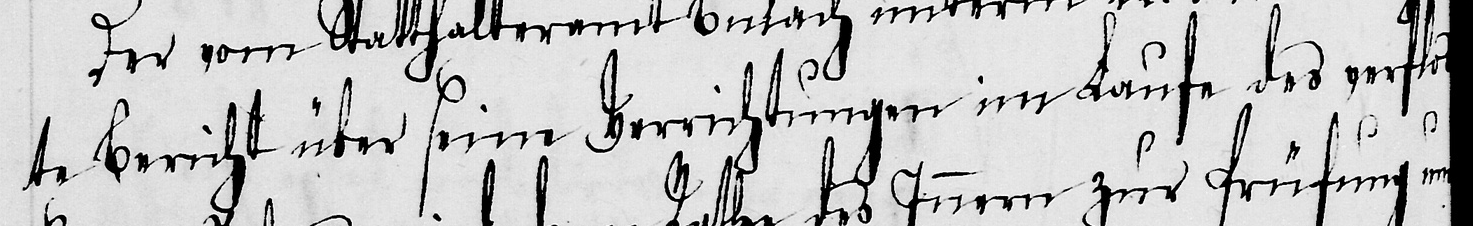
e Bericht über seine Verrichtungen im Laufe des verflo¬
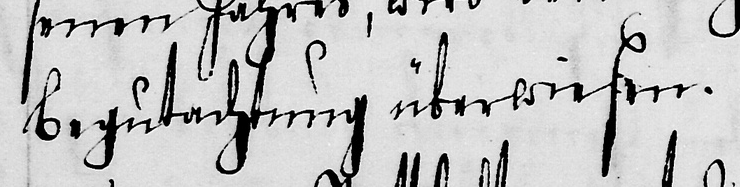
Begutachtung überwiesen.
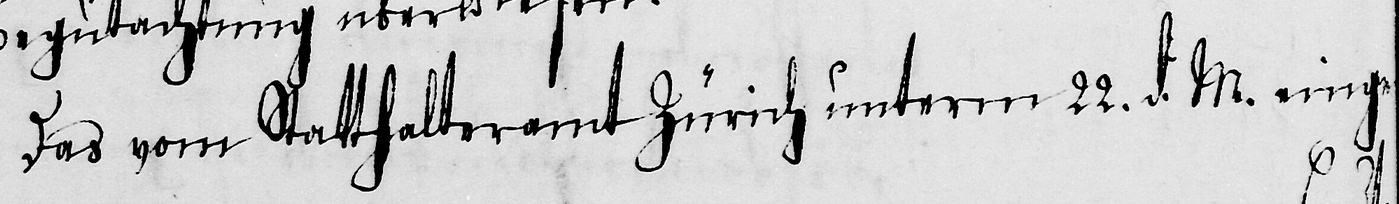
Das vom Statthalteramt Zürich unterm 22. d. M. eing¬
